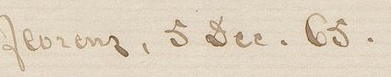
Florenz, 5 Dec. 65.
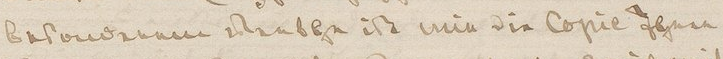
besonderem Werthe ist mir die Copie Ihrer
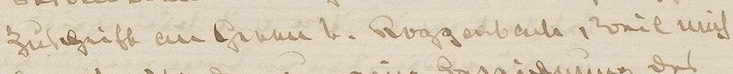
Zuschrift an Herrn v. Roggenbach, weil mich
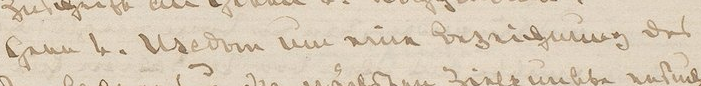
Herr v. Usedom um eine Bezeichnung des
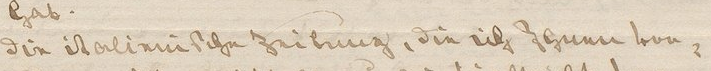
Die italienische Zeitung, die ich Ihnen vor-
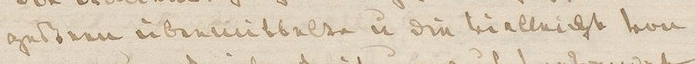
gestern übermittelte u die vielleicht von
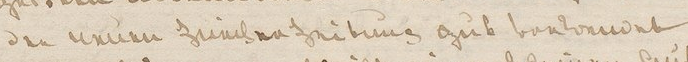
der neuen Zürcher Zeitung gut verwendet
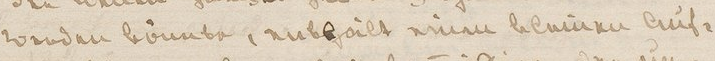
werden könnte, enthält einen kleinen Auf-
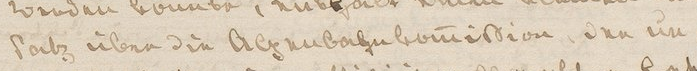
satz über die Alpenbahnkommission, der un-
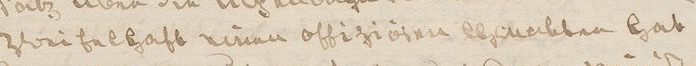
zweifelhaft einen offiziösen Charakter hat
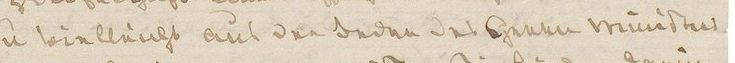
u vielleicht aus der Feder des Herrn Ministers
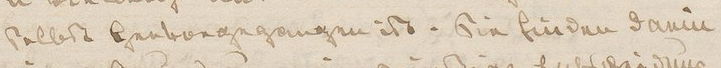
selbst hervorgegangen ist. Sie finden darin
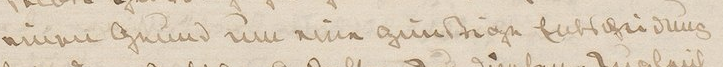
einen Grund um eine günstige Entscheidung
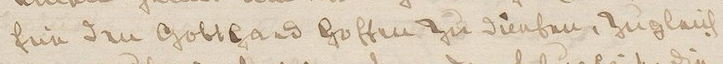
für den Gotthard hoffen zu dürfen, zugleich
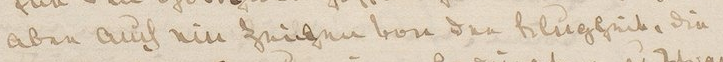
aber auch ein Zeichen von der Klugheit, die
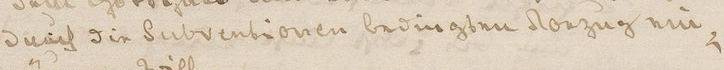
durch die Subventionen bedingten Vorzug ein-
